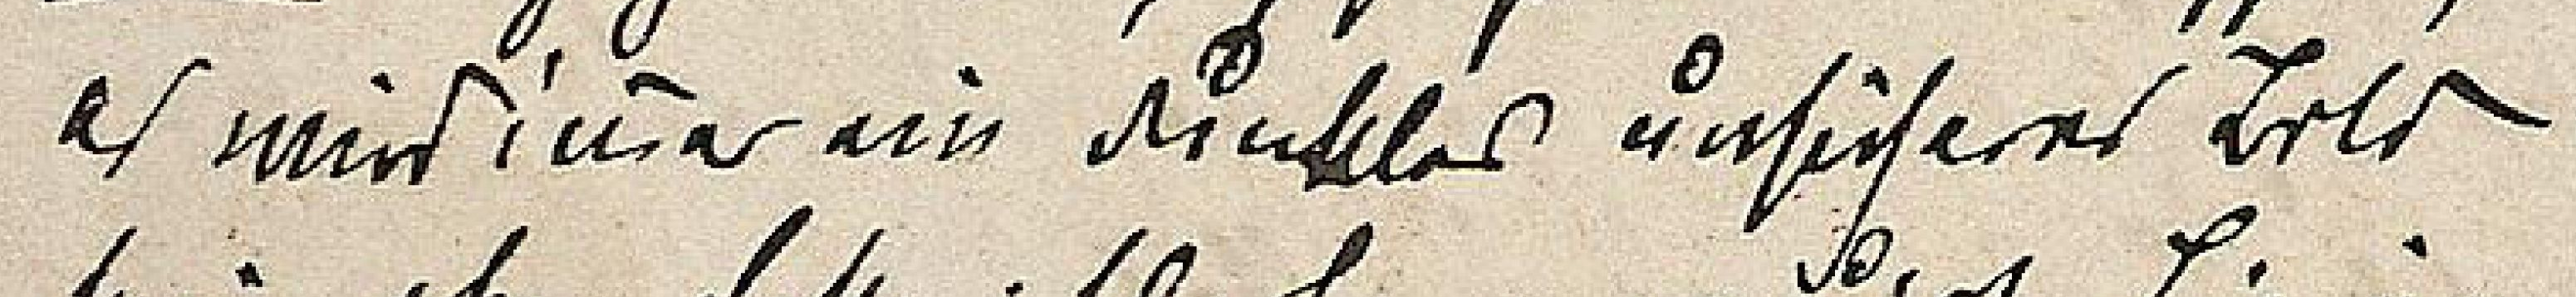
es wird imer ein dunkles unsicheres Bild
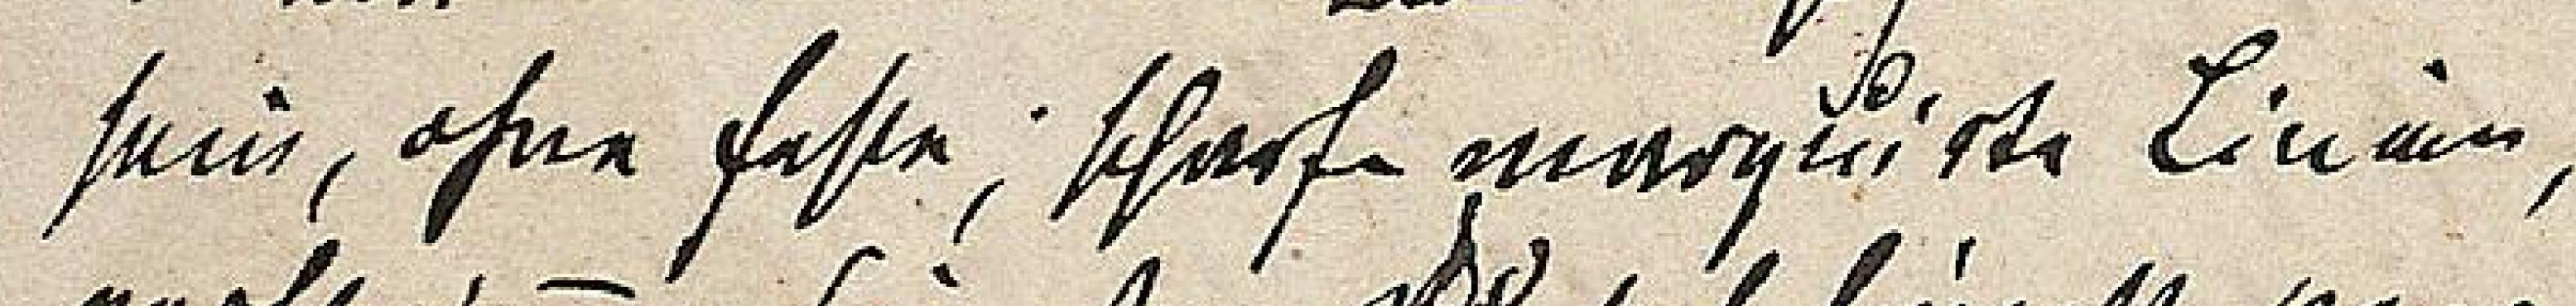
sein, ohne feste, scharfe marquirte Linien,
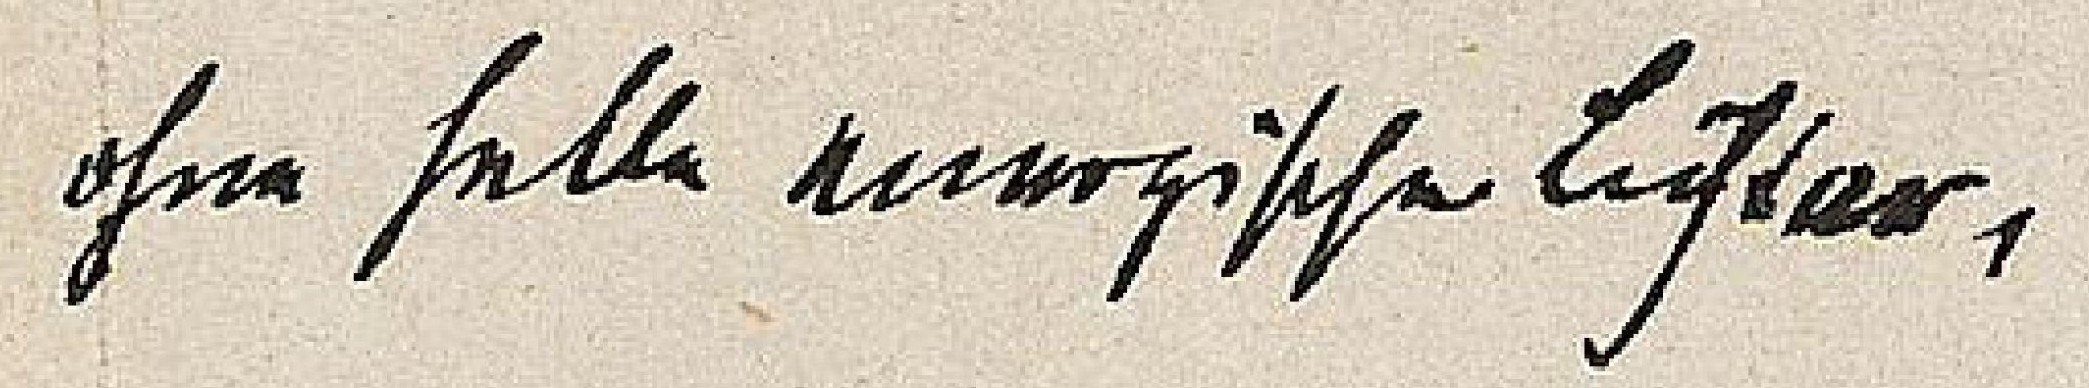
ohne helle energischen Lichter,
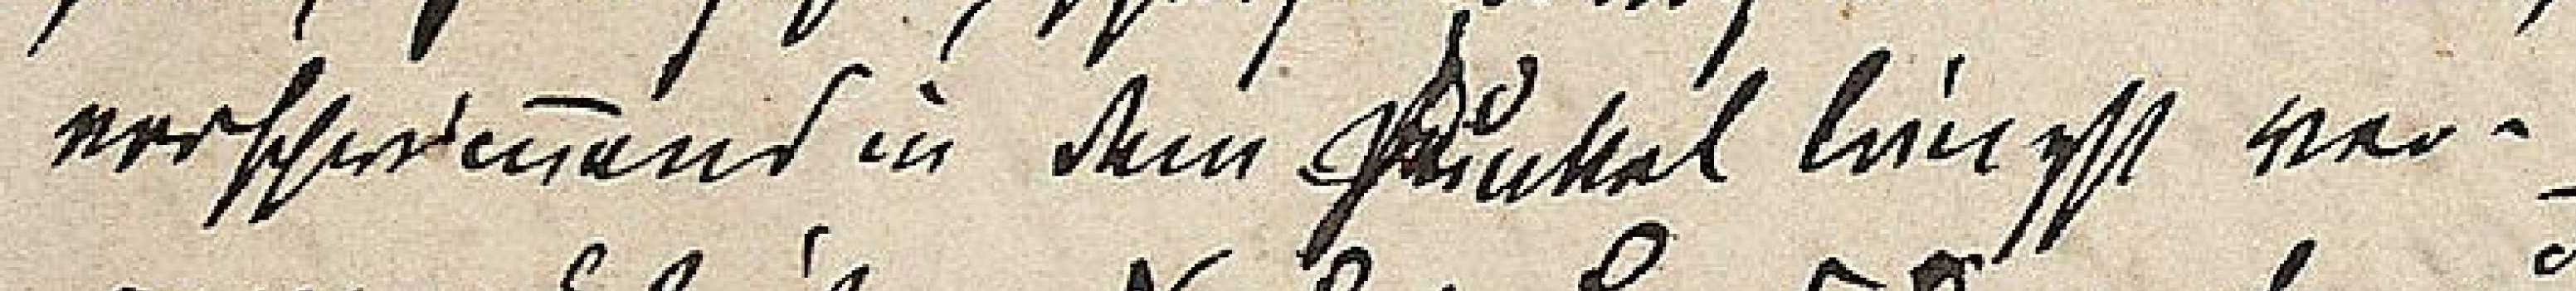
verschwimend in dem Dunkel längst ver¬
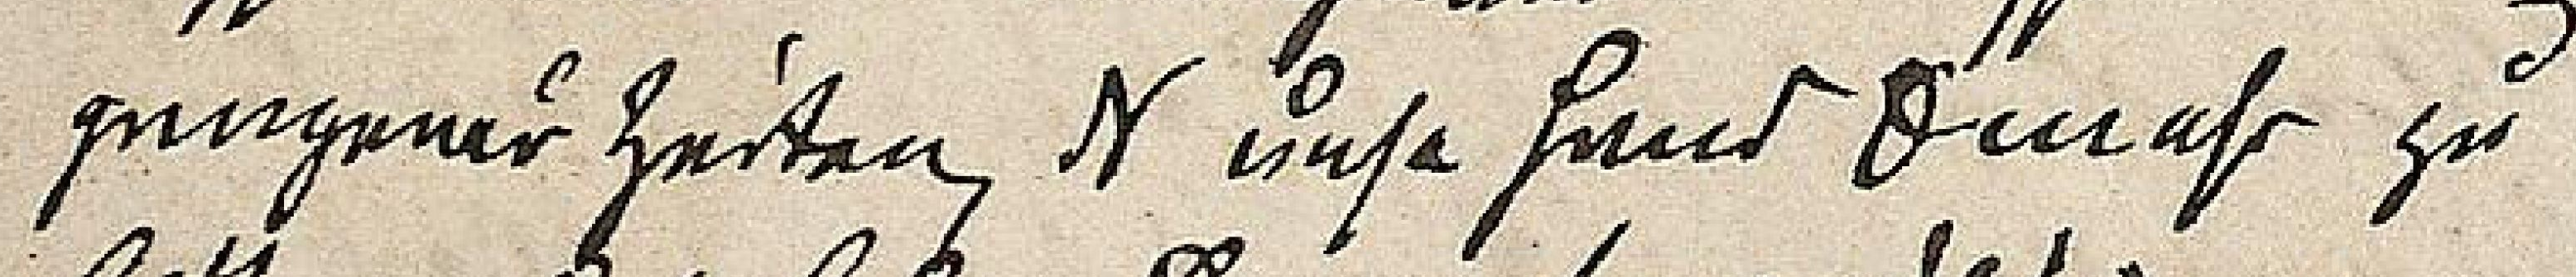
gangener Zeiten, das unsr Hand o mehr zu
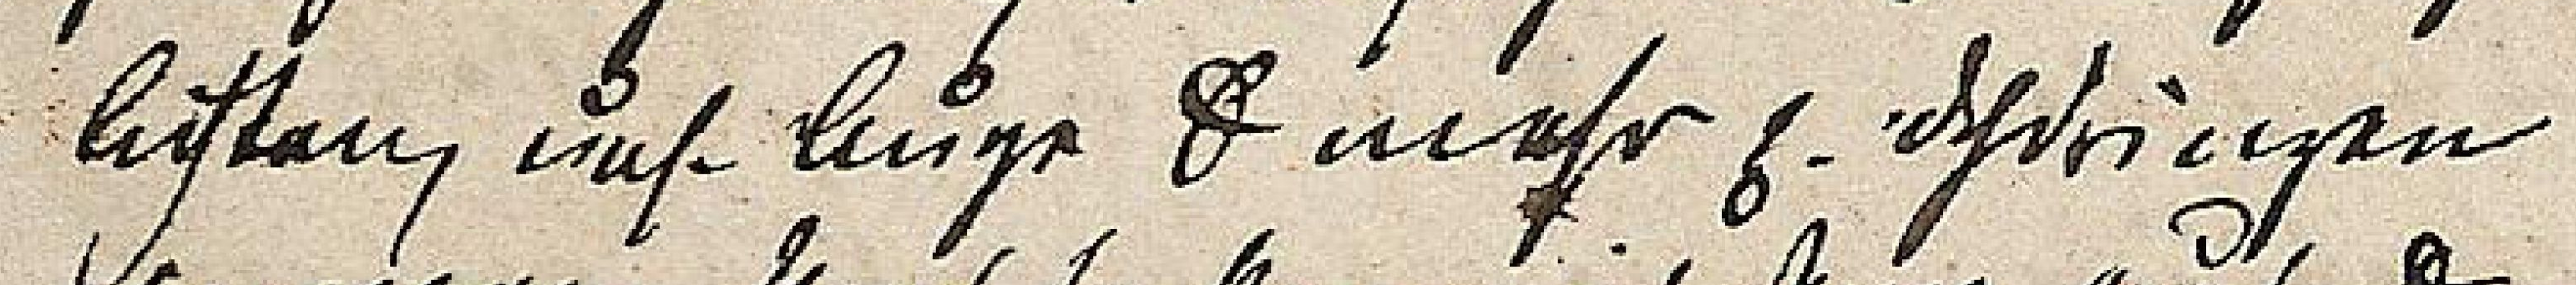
lüften, uns. Auge o mehr z. dchdringen
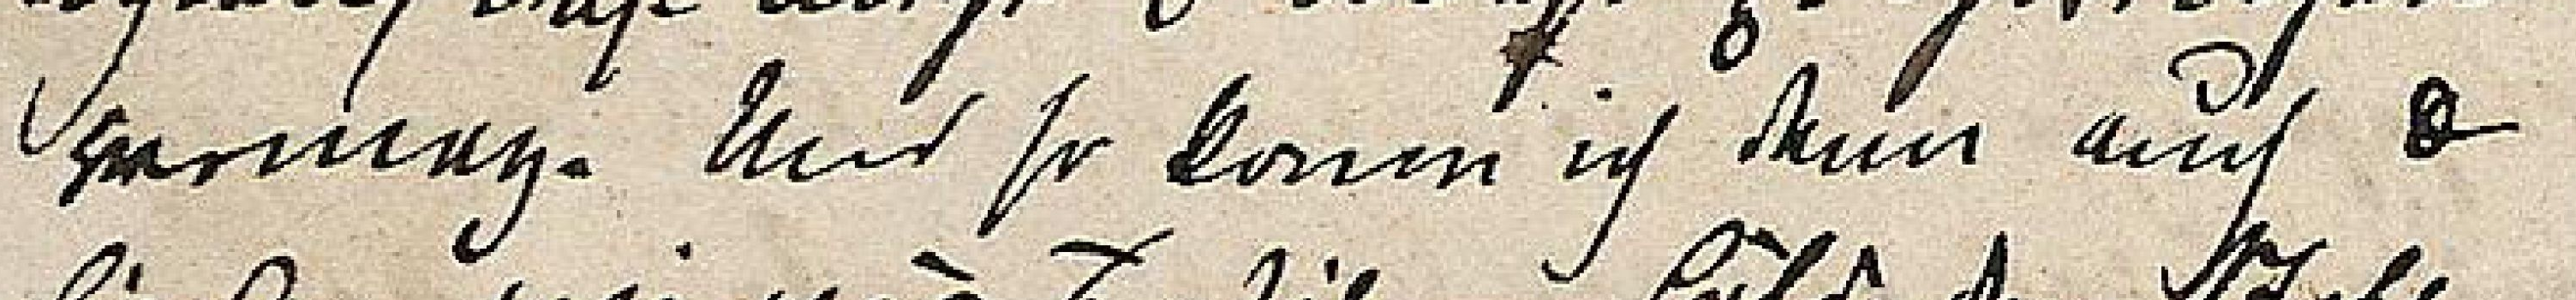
vermag. Und so kannn ich denn auch o
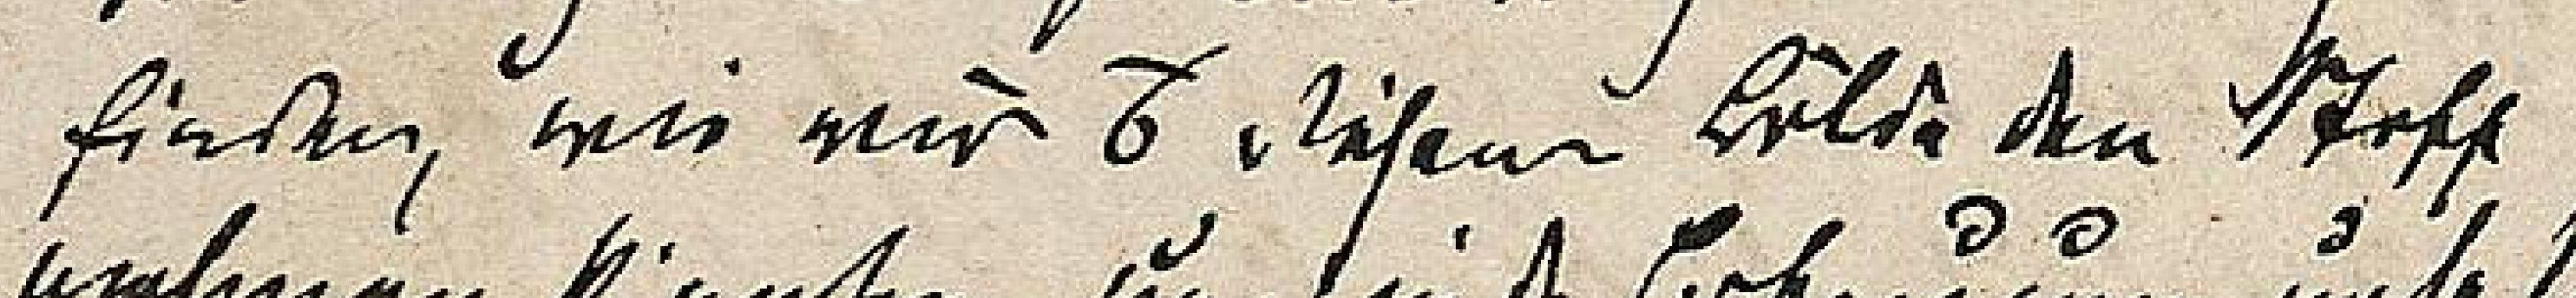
finden, wie wir s diesem Bilde den Stoff
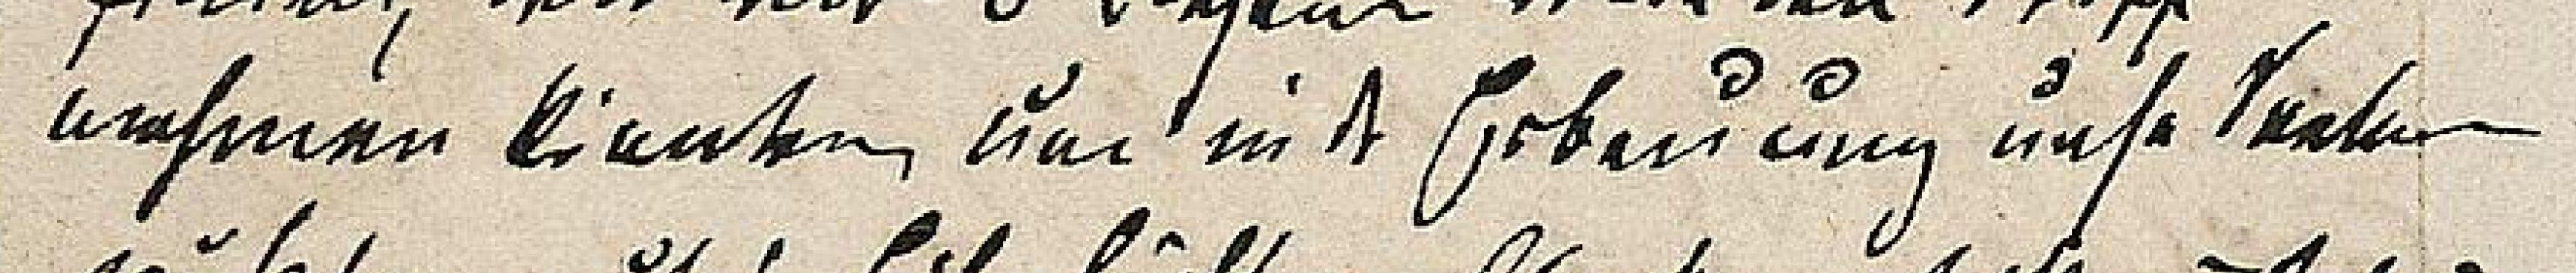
nehmen könnten, um mit Erbauung unse Seele
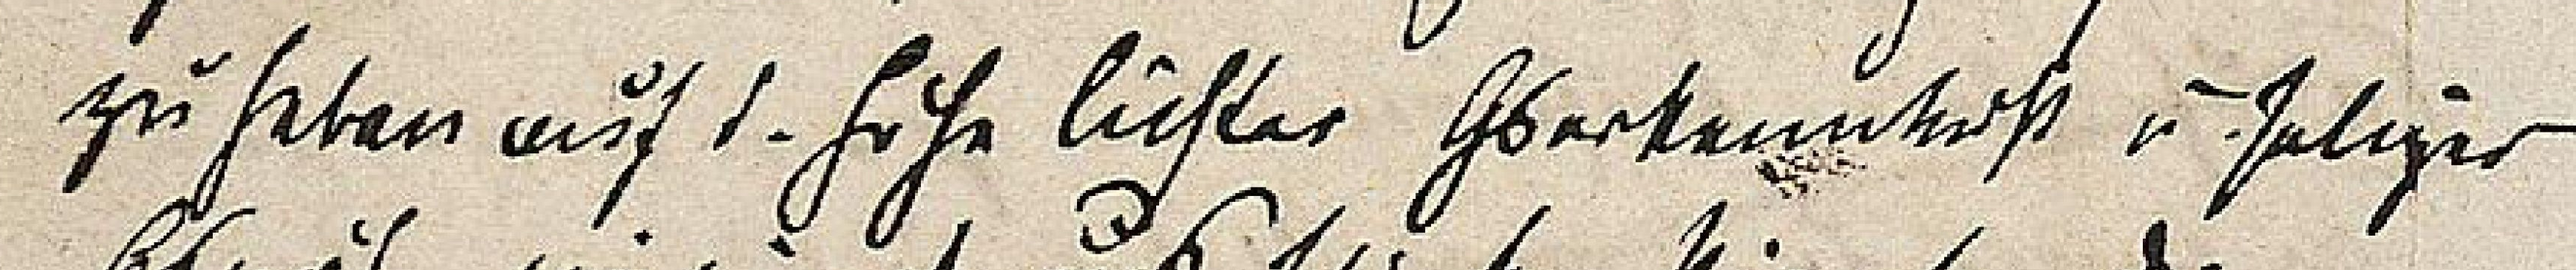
zu heben auf d. Höhe lichter Gserkenntniß u seliger
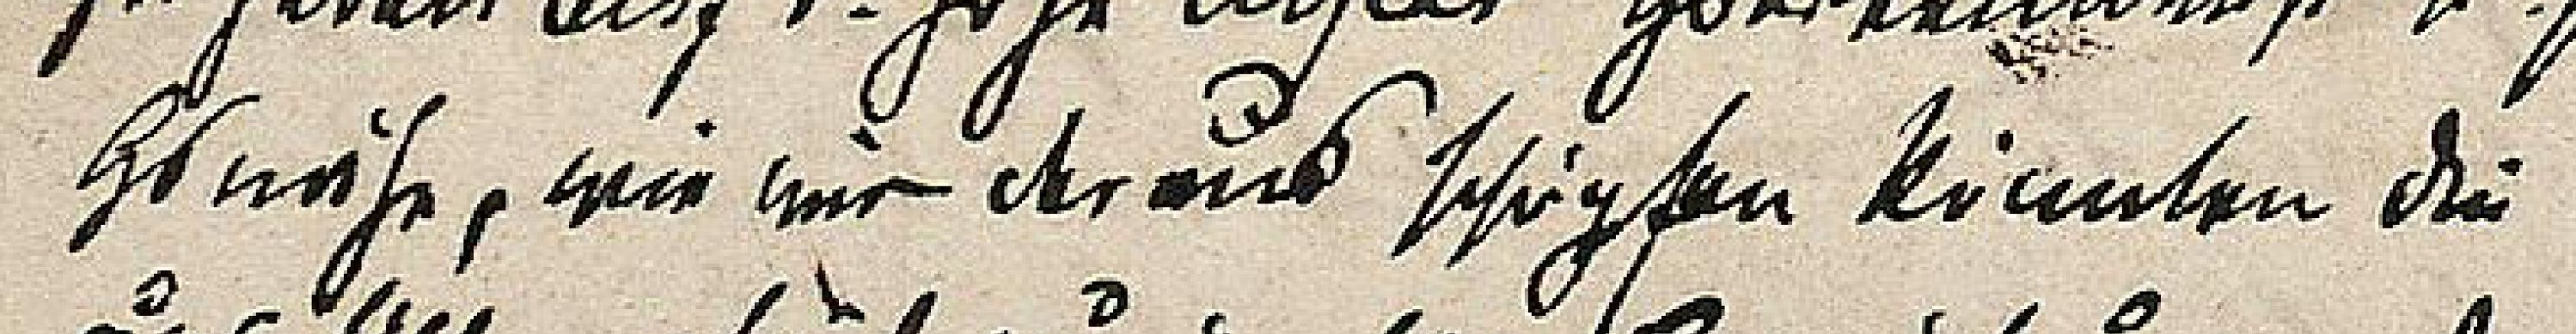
Gsrhe, wie wir daraus schöpfen könnten die
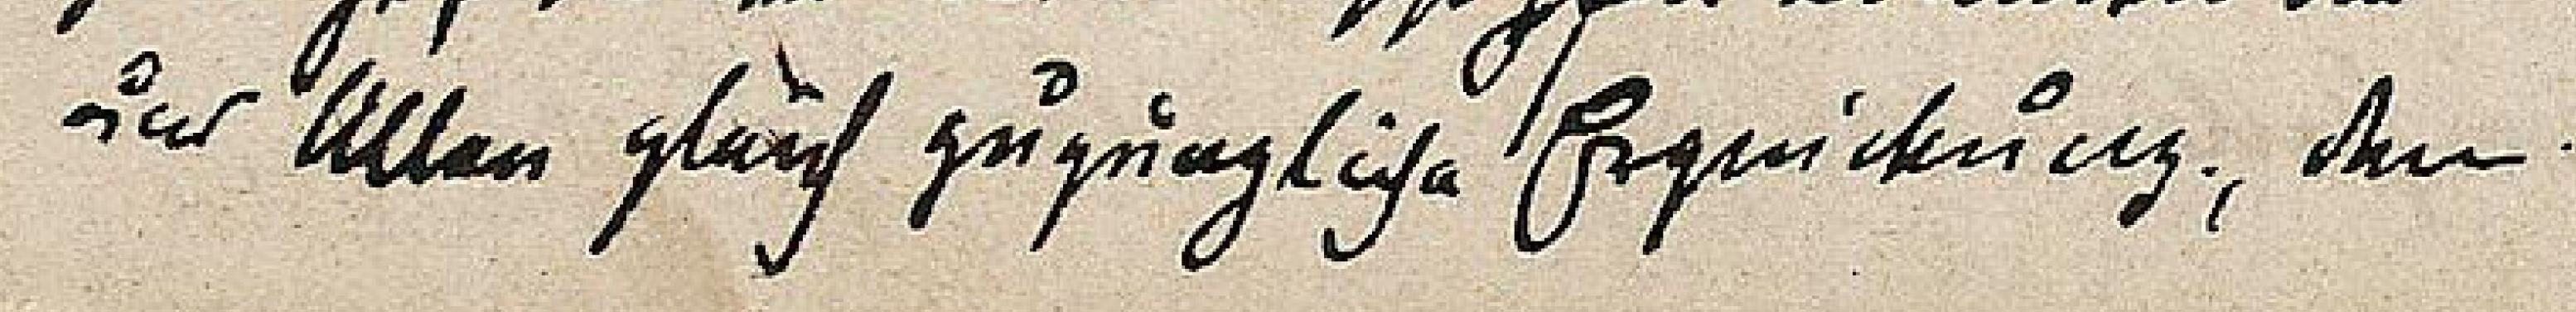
uns Allen gleich zugängliche Erquickung, den
